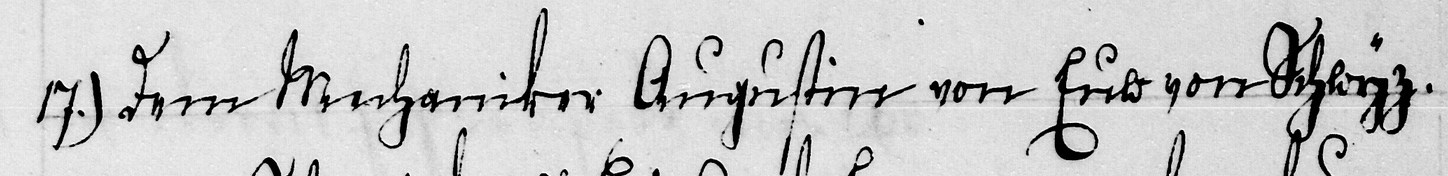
17.) Dem Mechaniker Augustin von Euw von Schwyz.
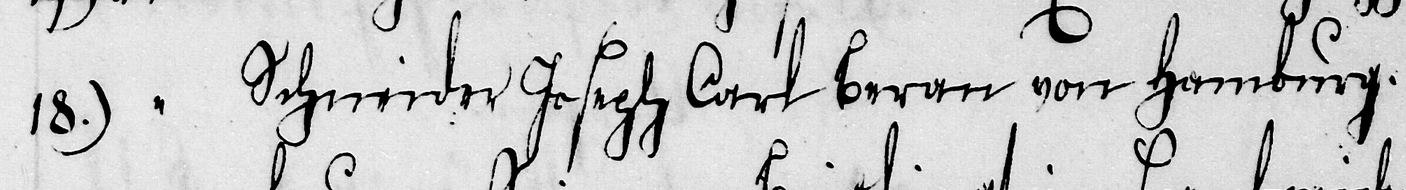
18.) “ Schneider Joseph Carl Beran von Hamburg.
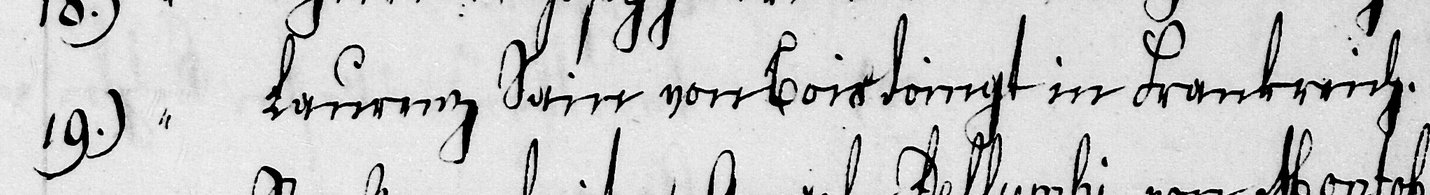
19.) “ Laurenz Sain von Boisdoingt in Frankreich.
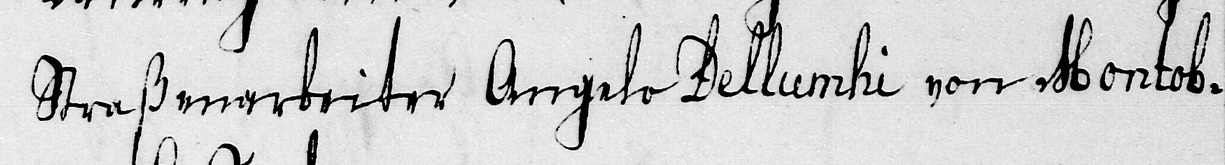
Straßenarbeiter Angelo Dellumhi von Montob¬
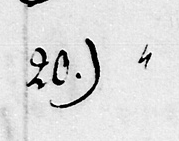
20.)
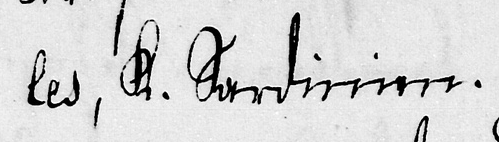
les, K. Sardinien.
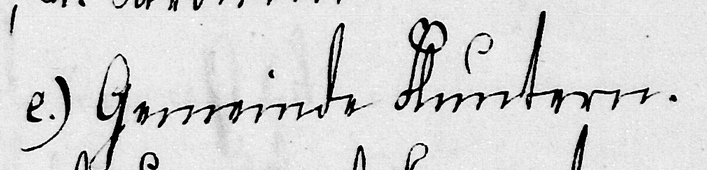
e.) Gemeinde Fluntern.
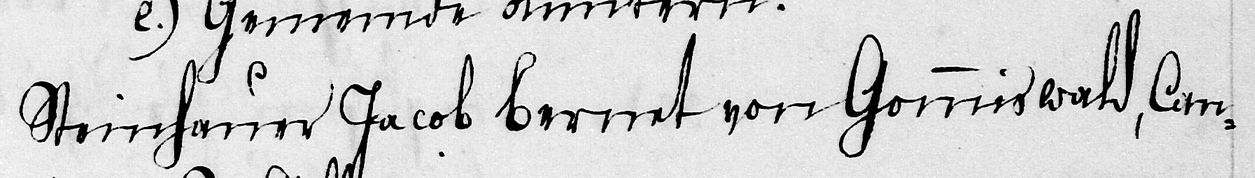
Steinhauer Jacob Bernet von Gommiswald, Can¬
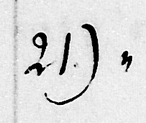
21.) “
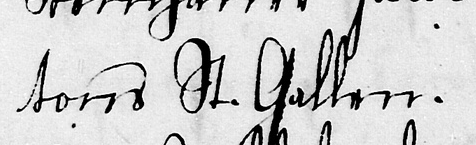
tons St. Gallen.
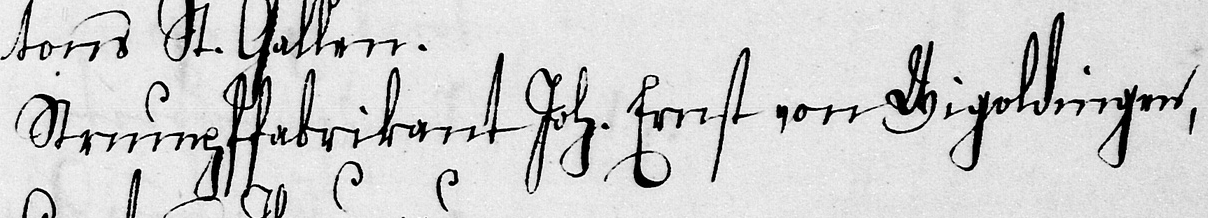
Strumpffabrikant Joh. Ernst von Wipoldigen,
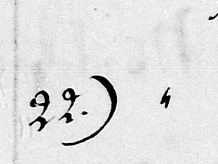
22.)
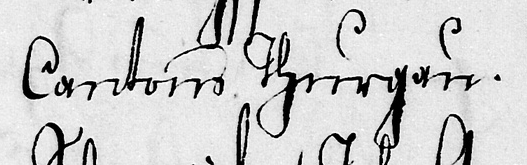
Cantons Thurgau.
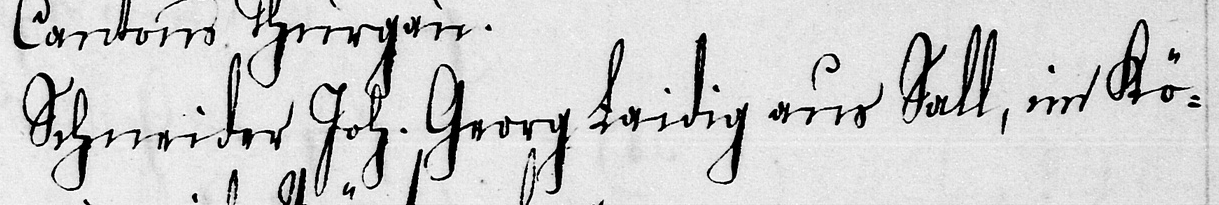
Schneider Joh. Georg Laidig aus Sall, im Kö¬
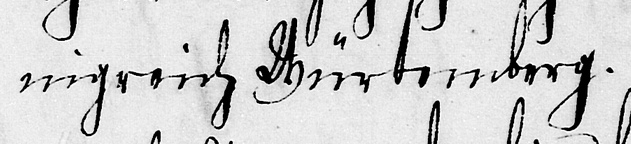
nigreich Würtemberg.
